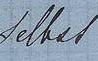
wirklich
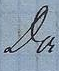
Sie
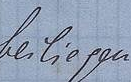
beiliegenden
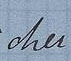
schriften
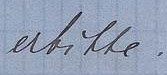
erbitte.
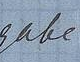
stelle
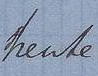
heute
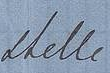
noch den
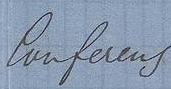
Conferenz
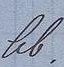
15t.
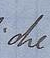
dss.
